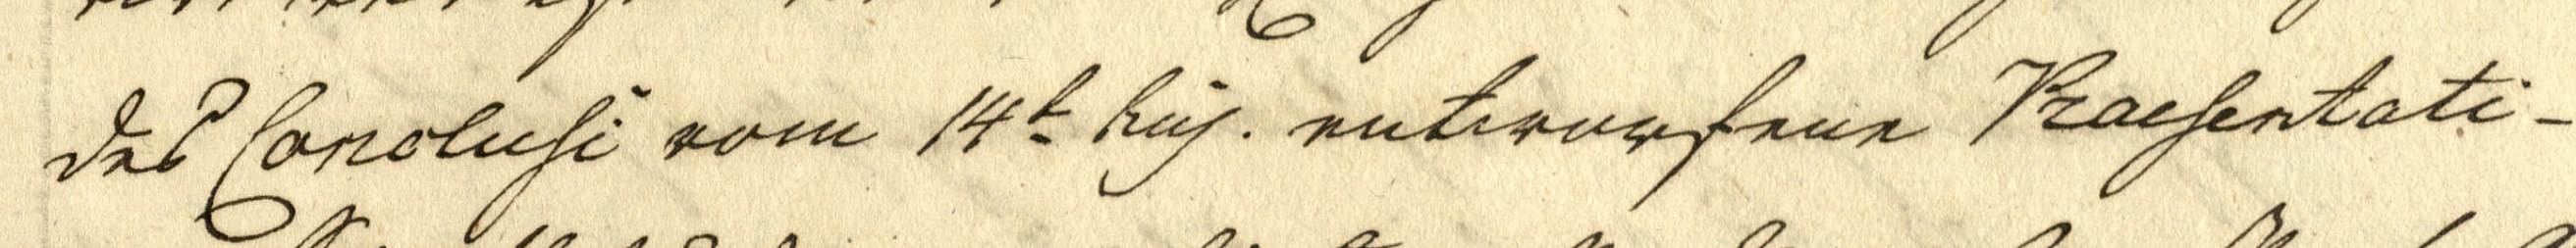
des Conclusi vom 14t. huius entworfene Praesentati-
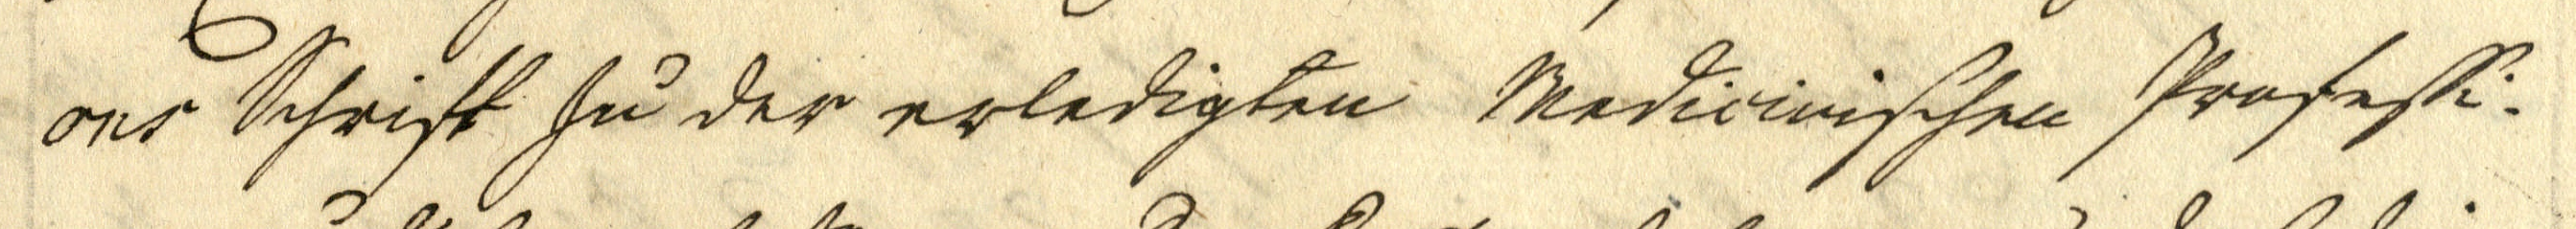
ons Schrift zu der erledigten Medicinischen Professi-
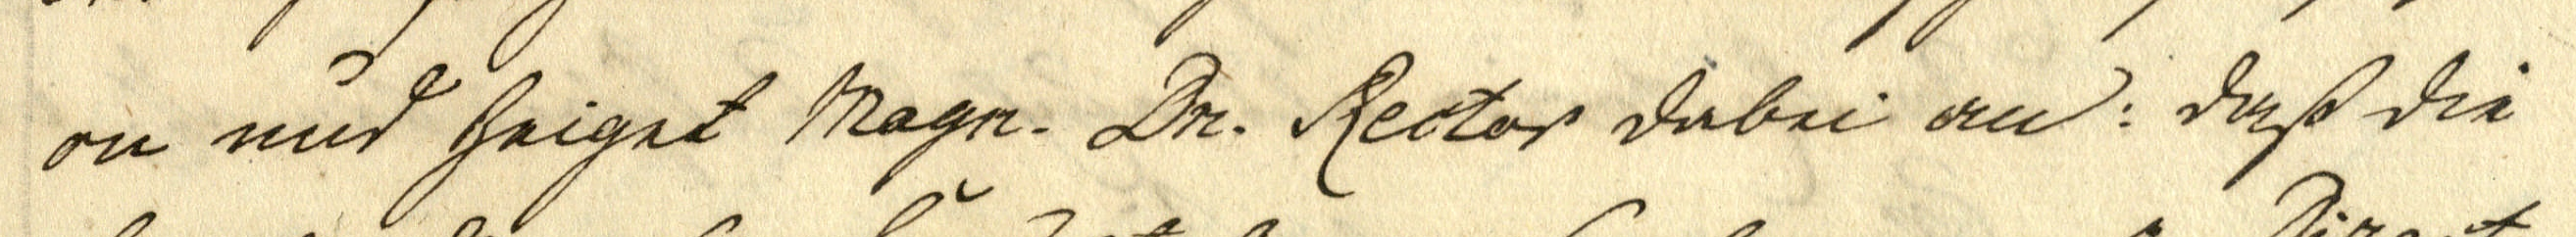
on und zeiget Magn. Dn. Rector dabei an: daß die
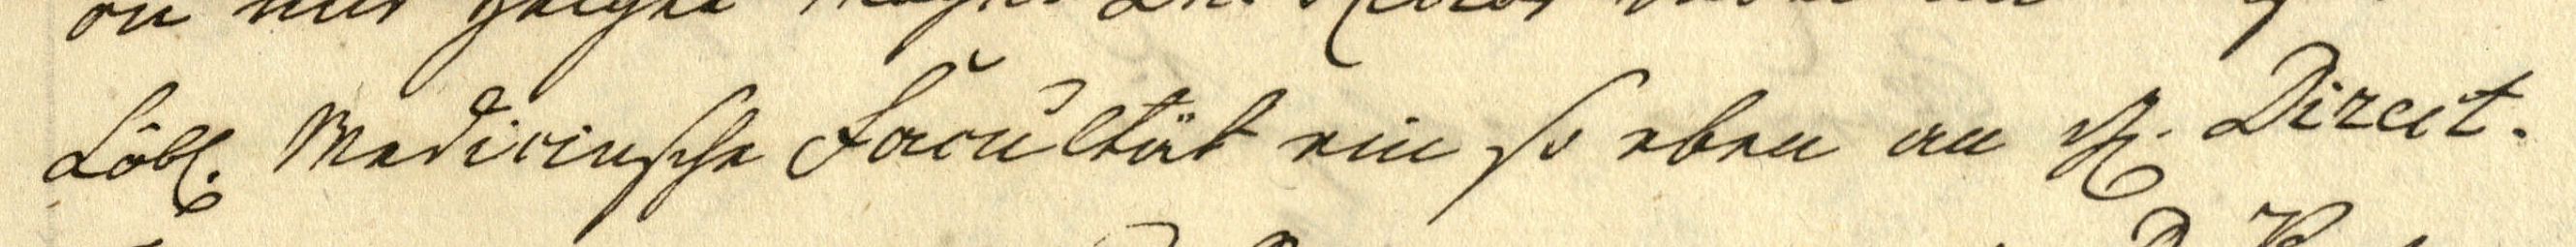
Löbl. Medicinische Facultät ein so eben an dh. Direct.
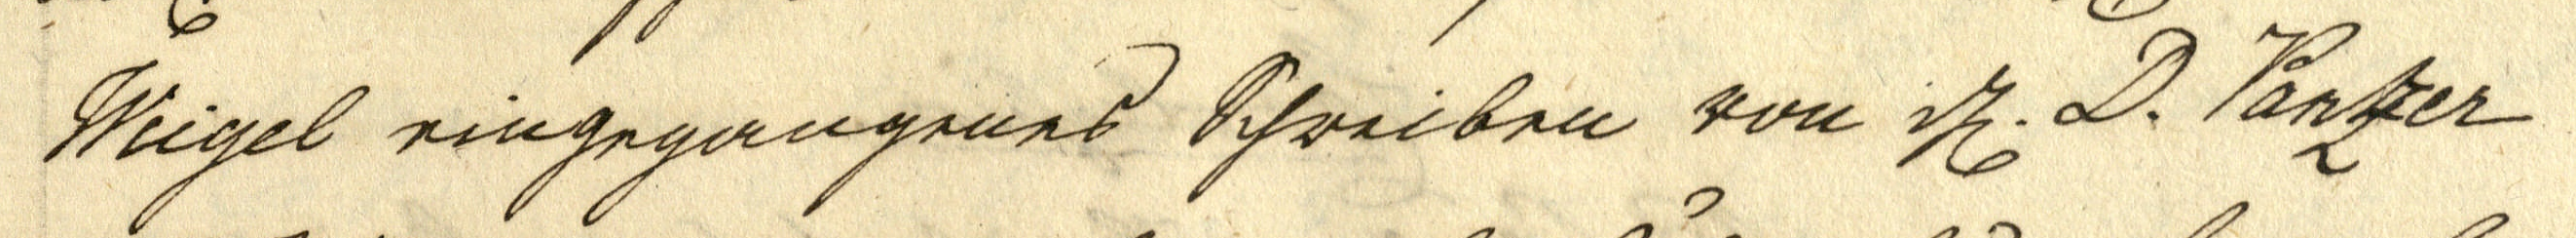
Weigel eingegangenes Schreiben von dh. D. Pantzer
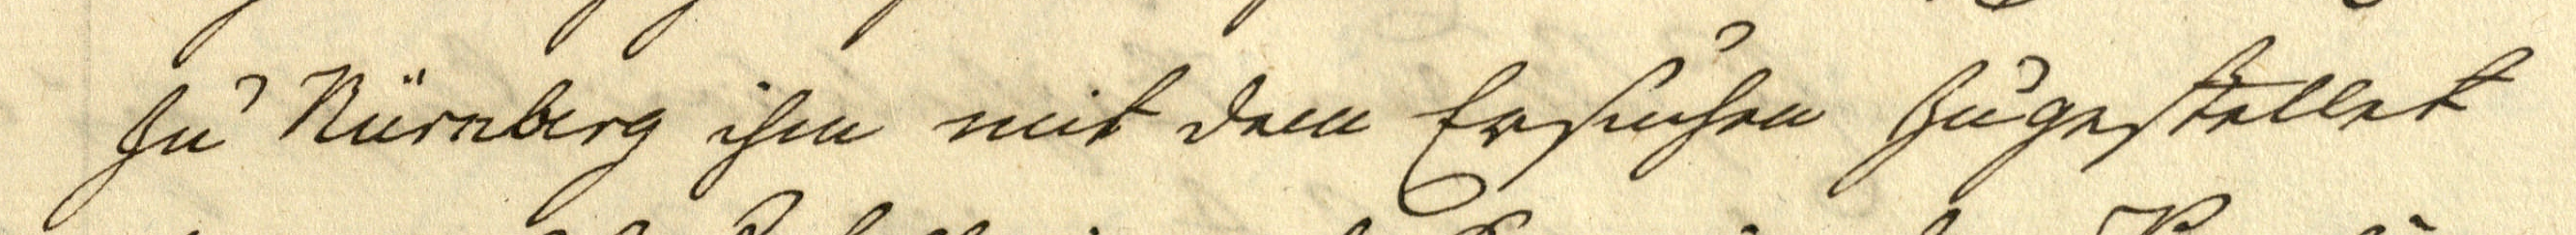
zu Nürnberg ihm mit dem Ersuchen zugestellet
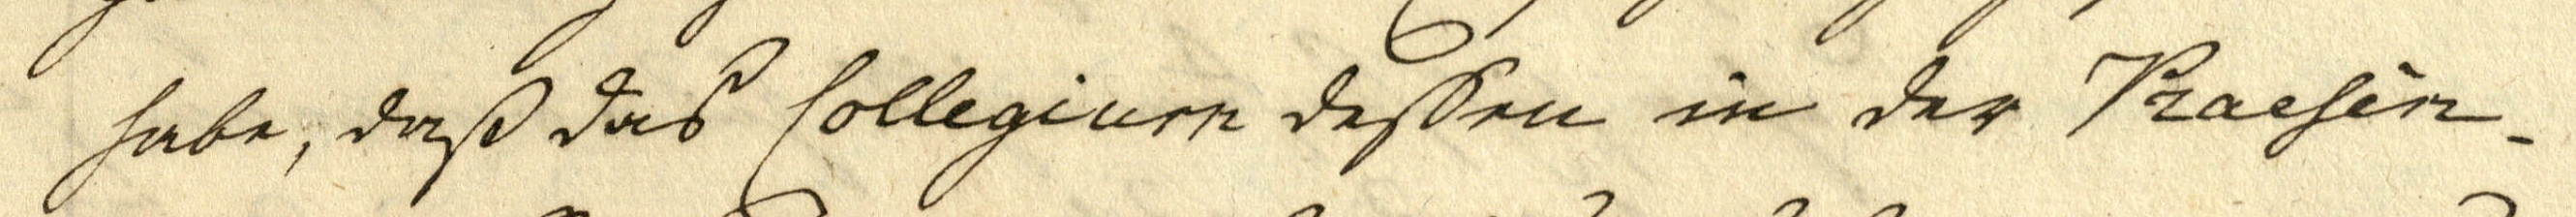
habe, daß das Collegium dessen in der Praesen-
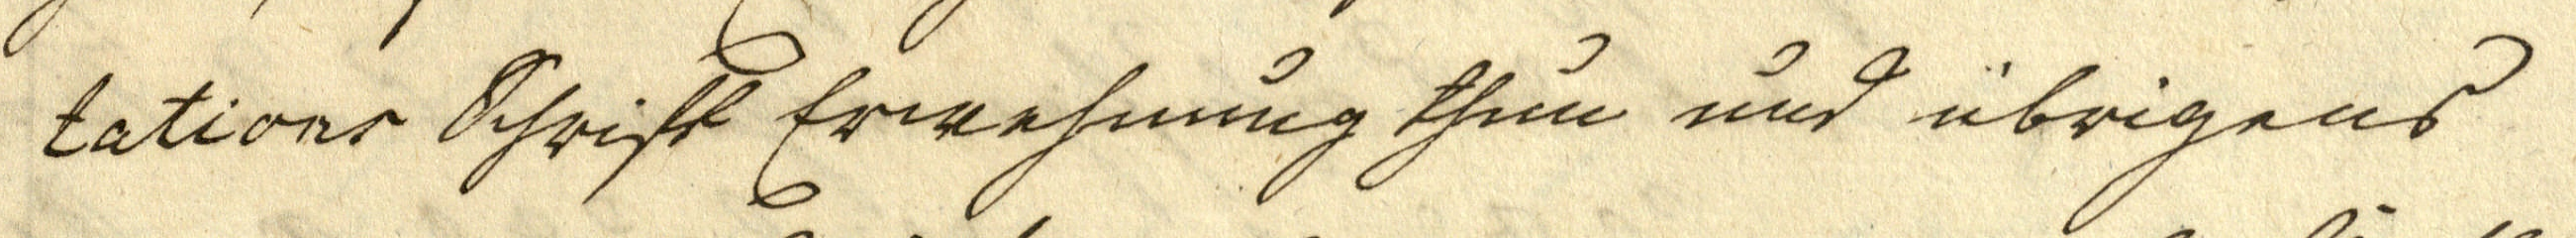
tations Schrift Erwehnung thun und übrigens
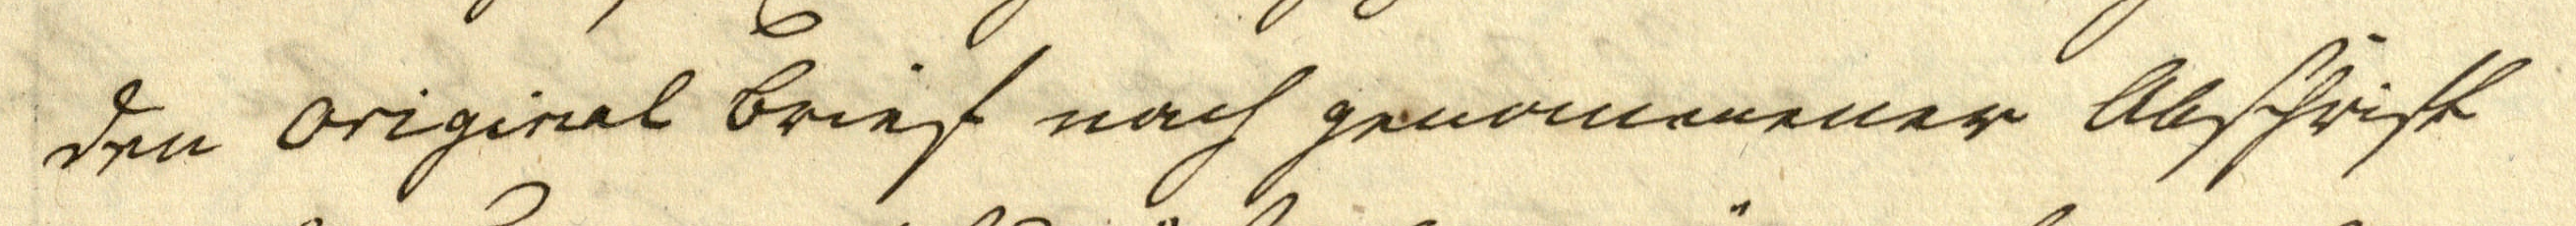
den Original Brief nach genommener Abschrift
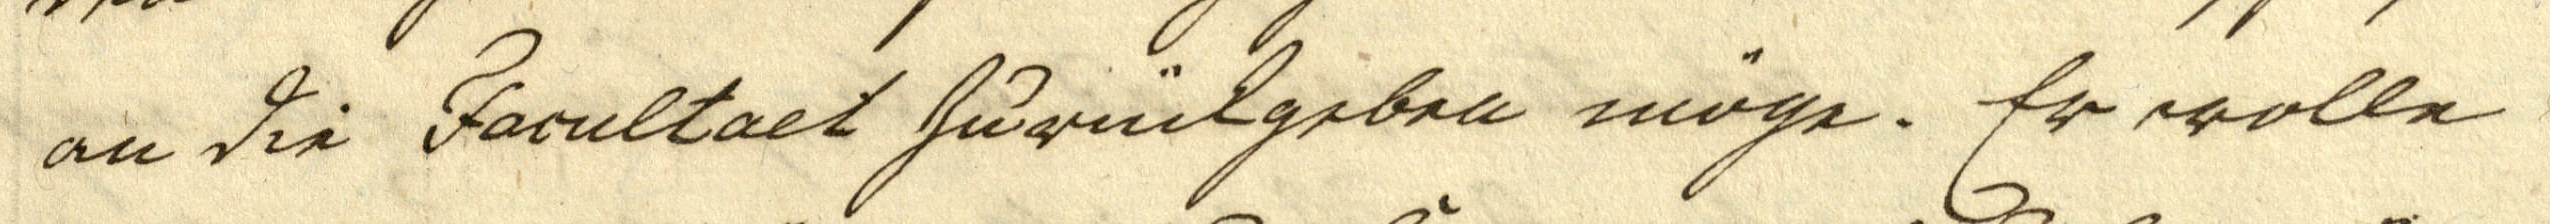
an die Facultaet zurückgeben möge. Er wolle
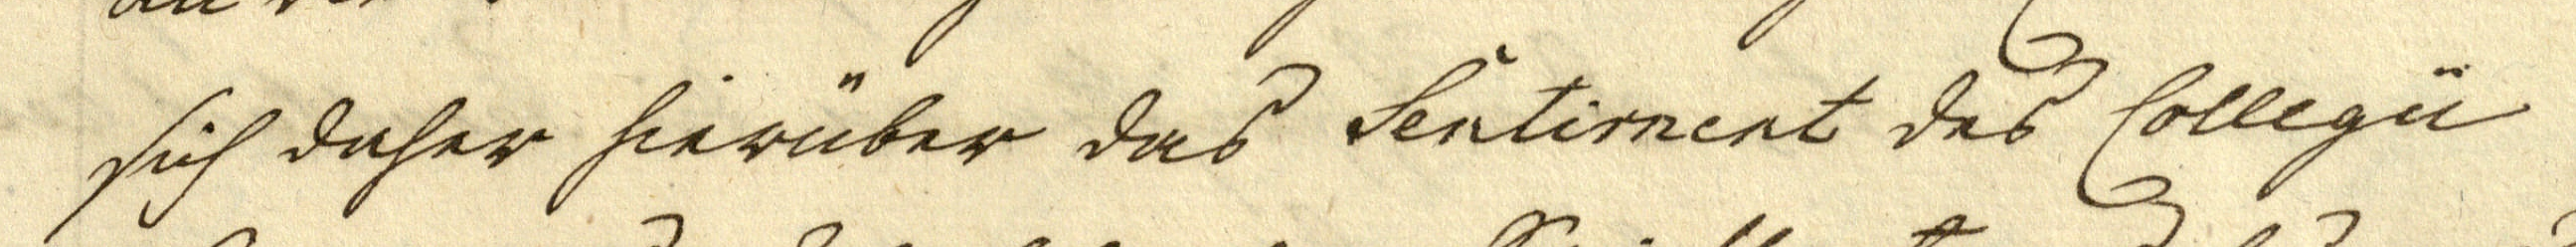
sich daher hierüber das Sentiment des Collegii
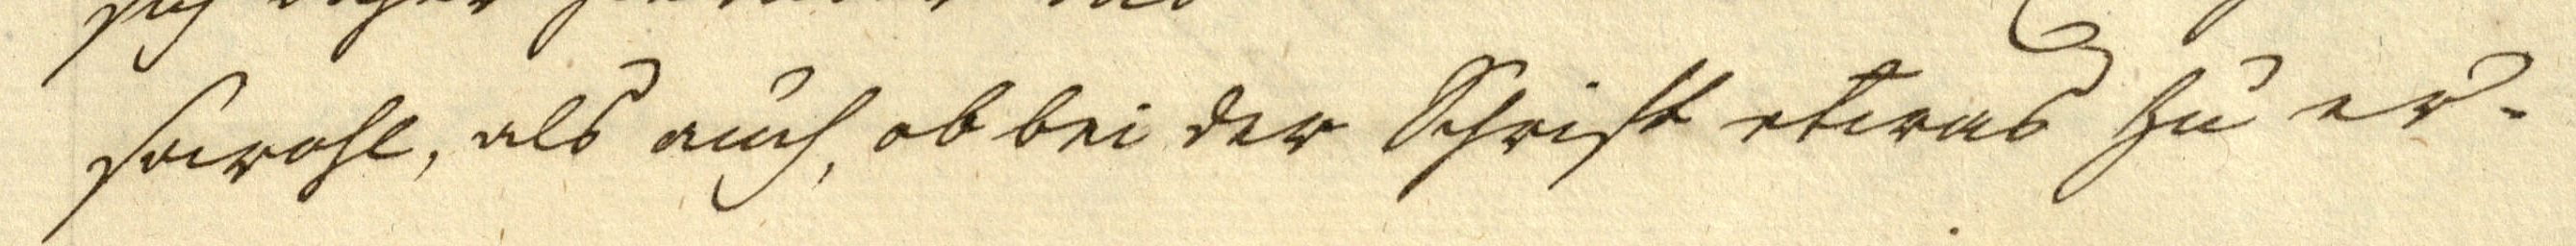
sowohl, als auch, ob bei der Schrift etwas zu er-
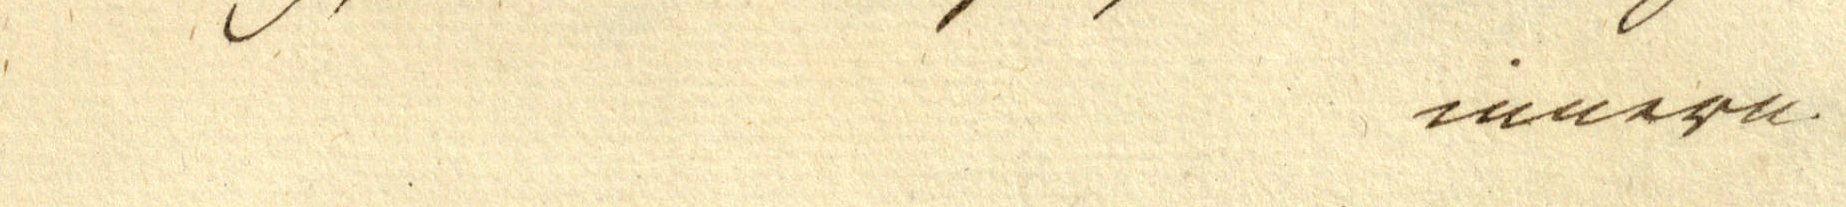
innern.
